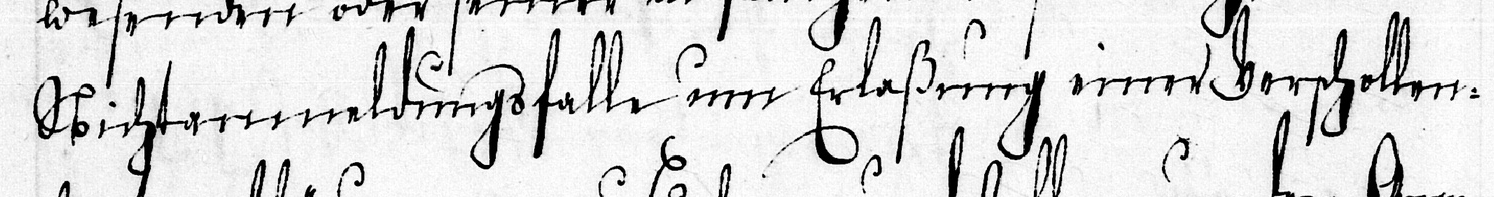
Nichtanmeldungsfalle um Erlaßung einer Verschollen¬
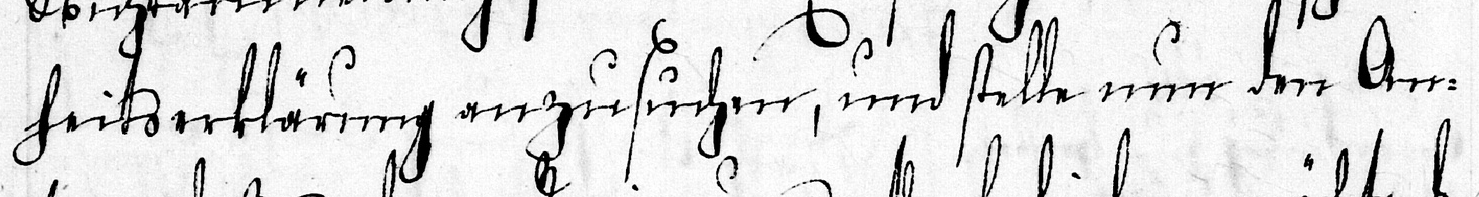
heitserklärung anzusuchen, und stelle nun den An¬
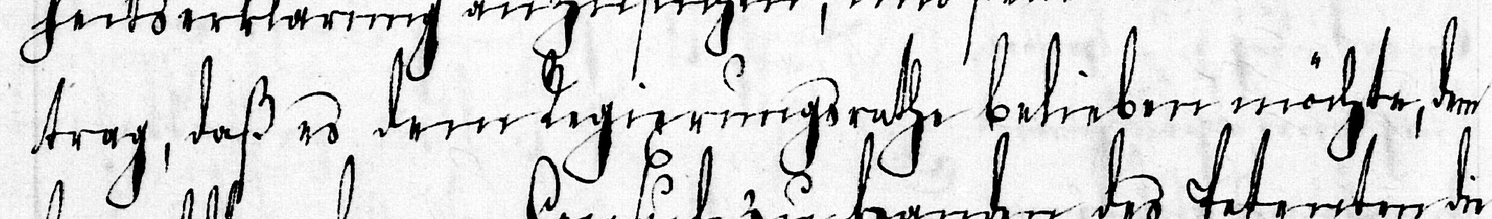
trag, daß es dem Regierungsrathe belieben möchte, dem
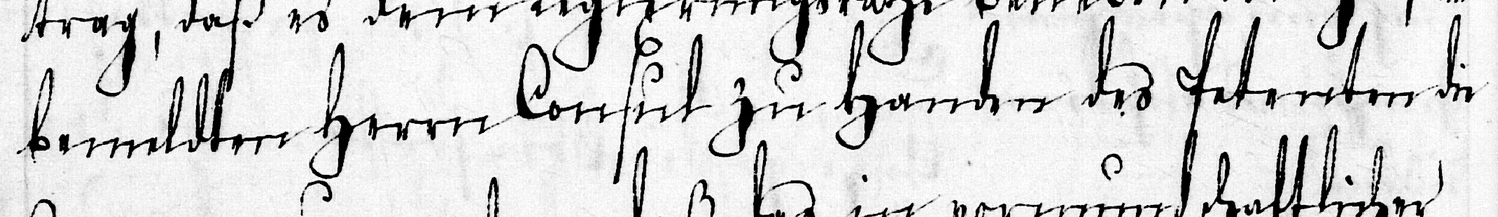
bemeldten Herrn Consul zu Handen des Petenten die
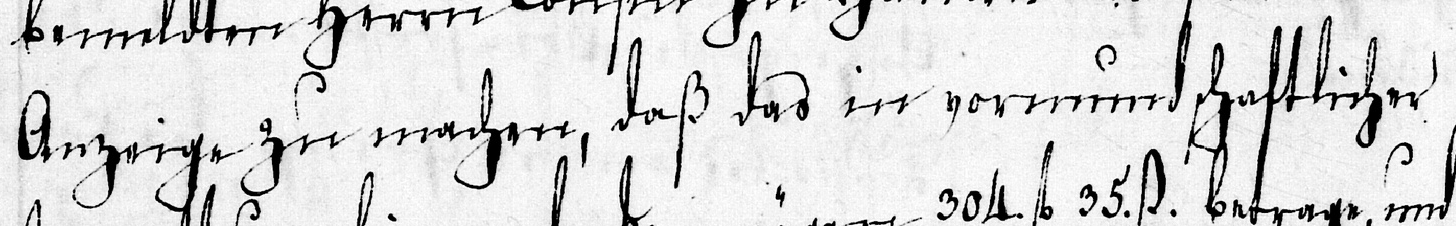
Anzeige zu machen, daß das in vormundschaftlicher
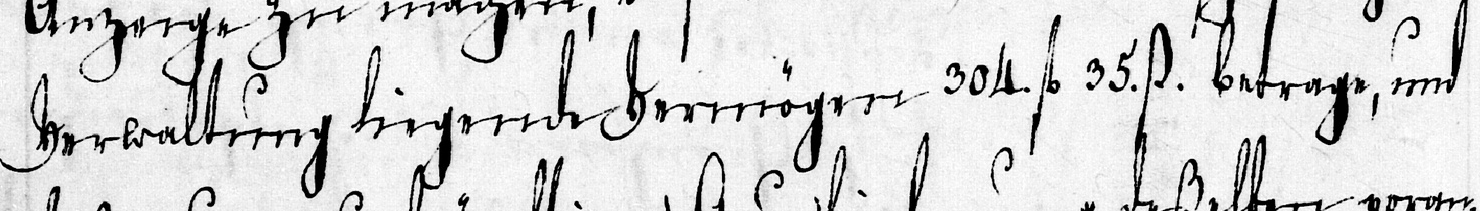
Verwaltung liegende Vermögen 304. fl 35. ß betrage, und
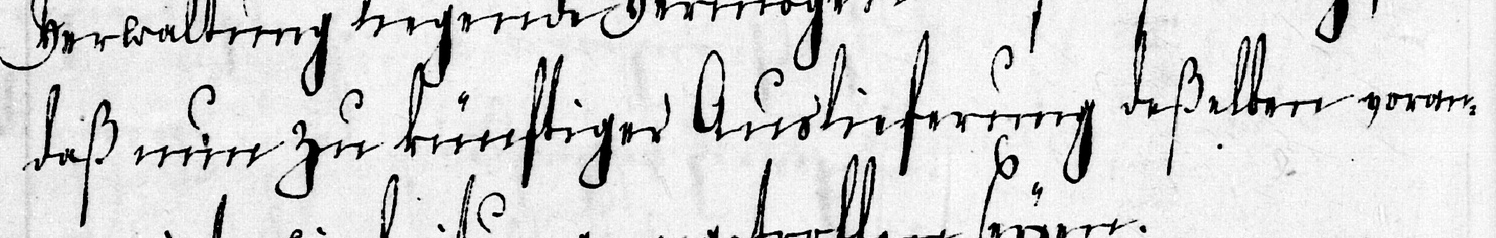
daß nun zu künftiger Auslieferung deßelben voran¬
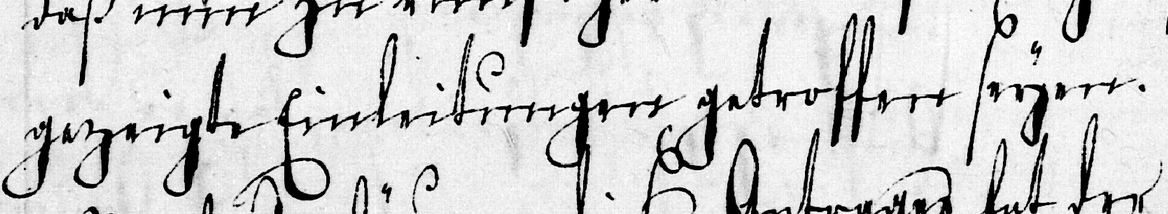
gezeigte Einleitungen getroffen seyen.
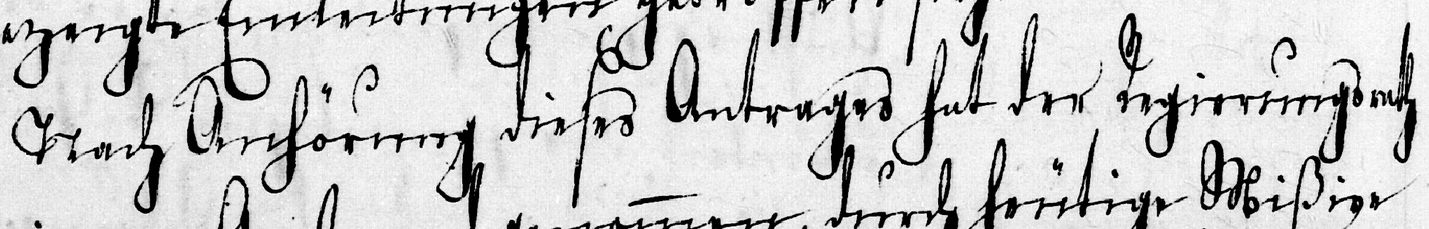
Nach Anhörung dieses Antrages hat der Regierungsra¬
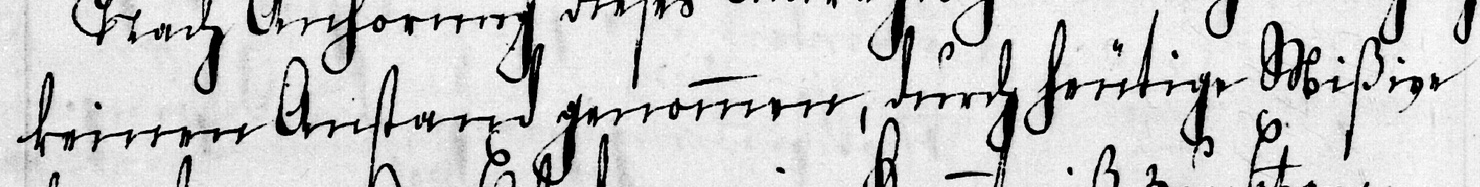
keinen Anstand genommen, durch heutige Mißive
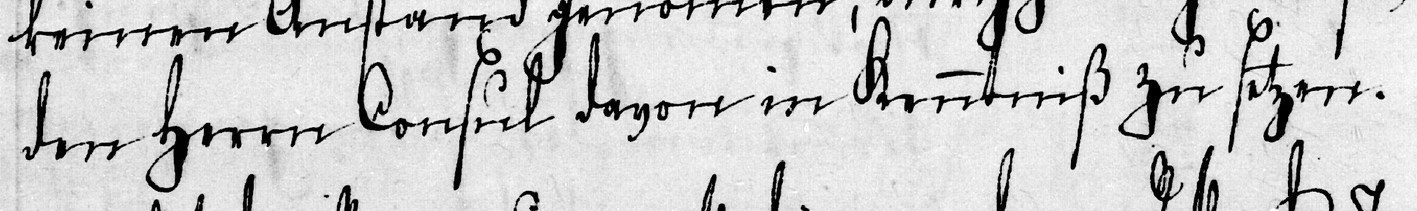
den Herrn Consul davon in Kenntniß zu setzen.
